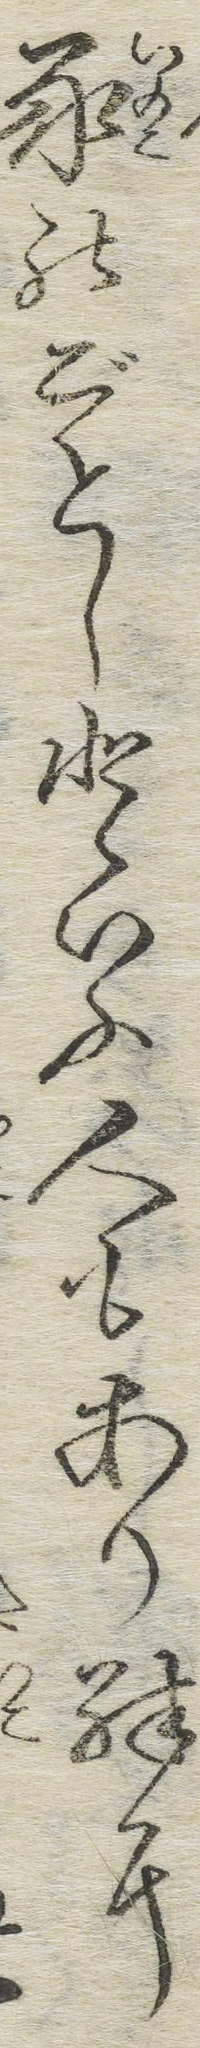亥のごとしといふ人もあり殊に
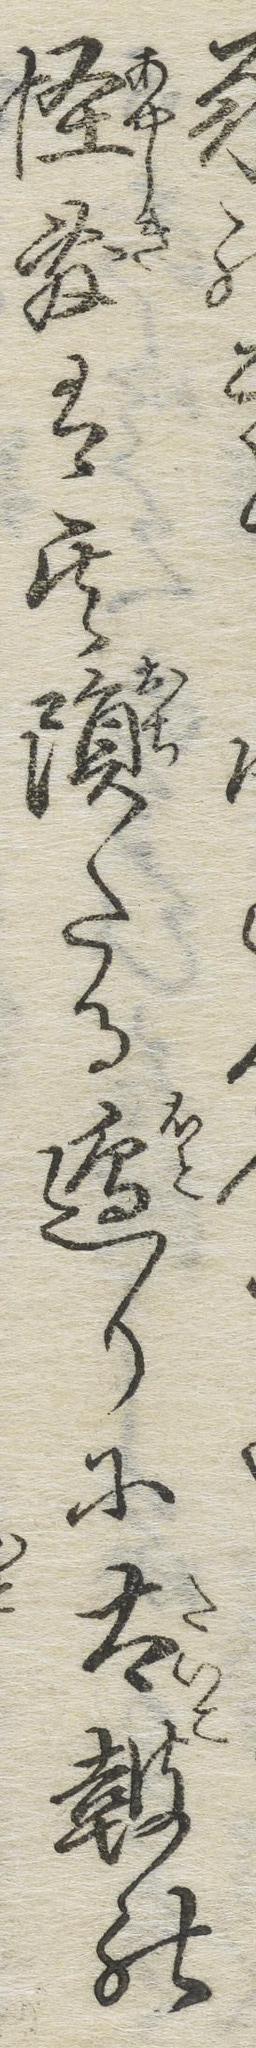怪敷は其隕たる辺りに太皷の
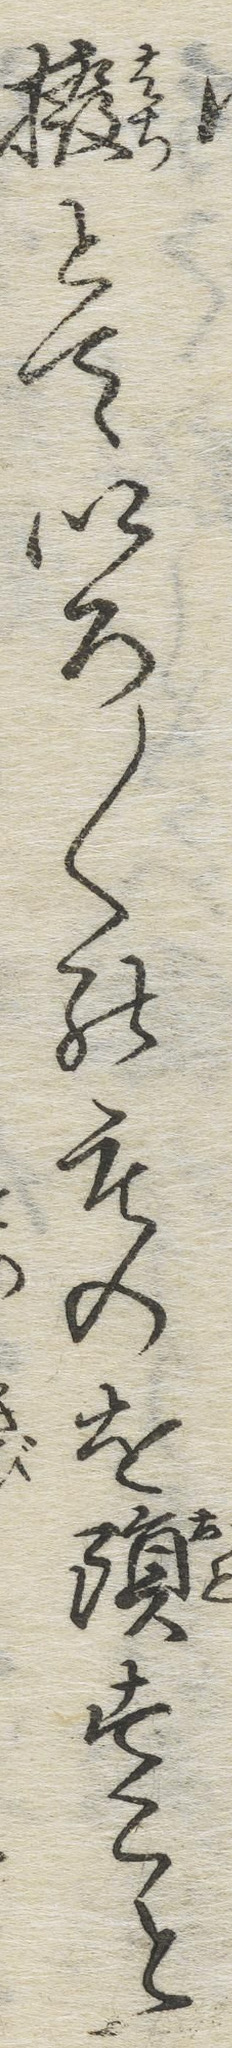撥とていろ〳〵のものを隕すこと
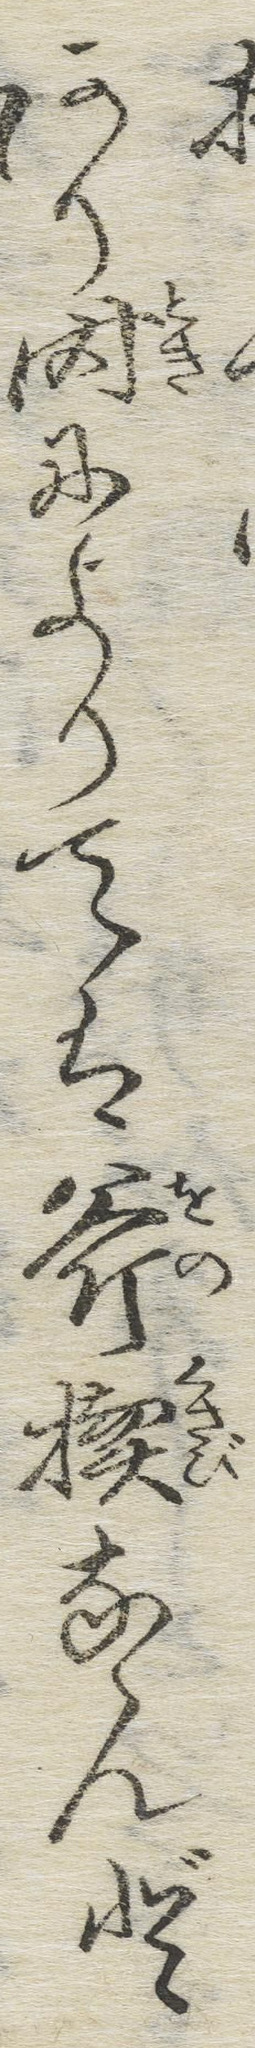あり時によりては斧楔なんど
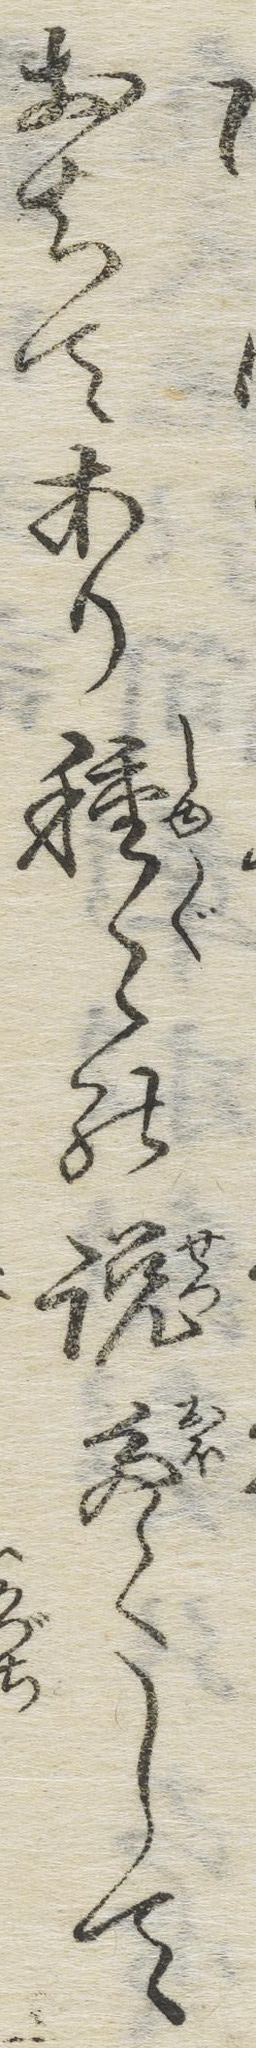おちてあり種々の説多くして
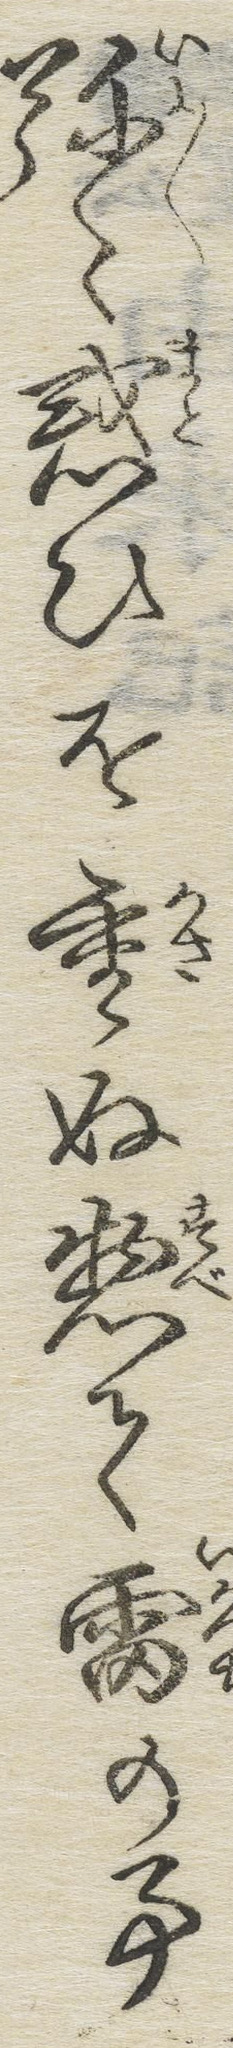弥々惑ひを重ね惣て雷の事
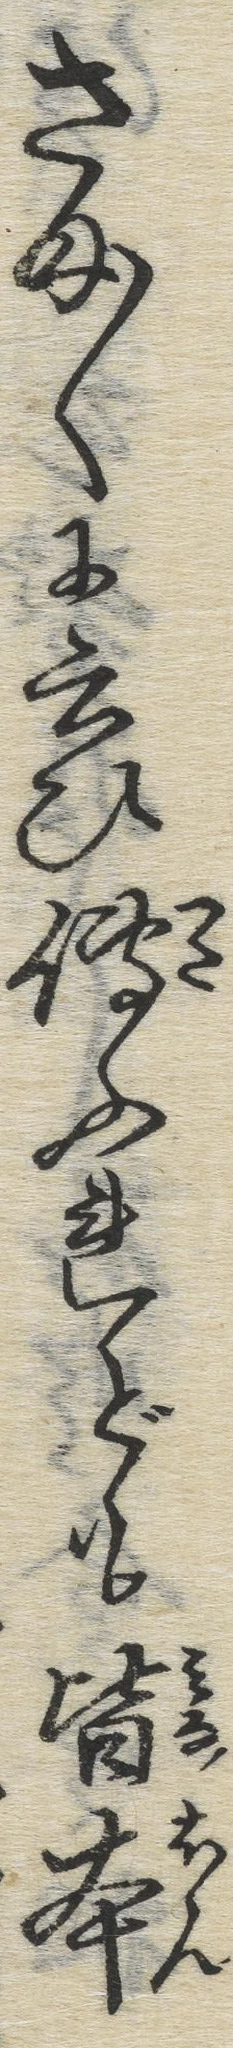さま〳〵に云ひ伝ふれども皆本
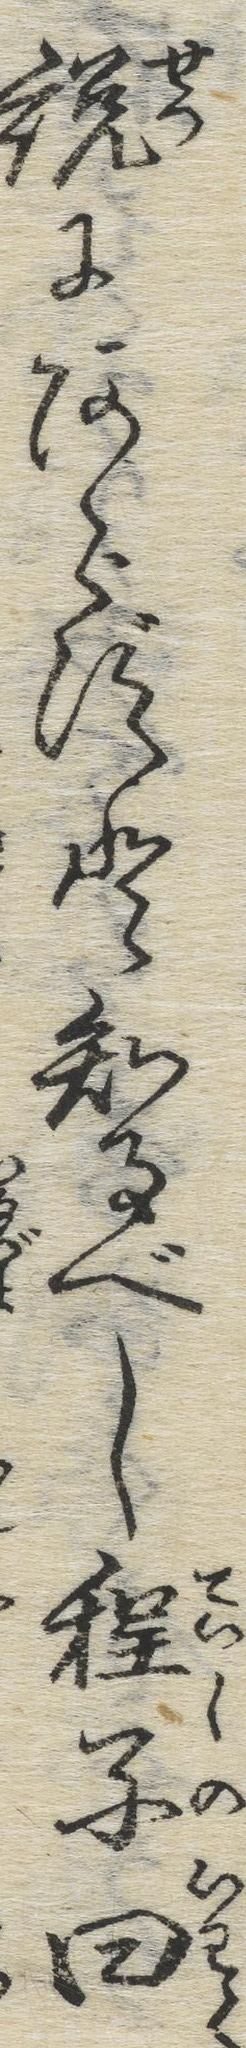説にあらずと知るべし程子曰
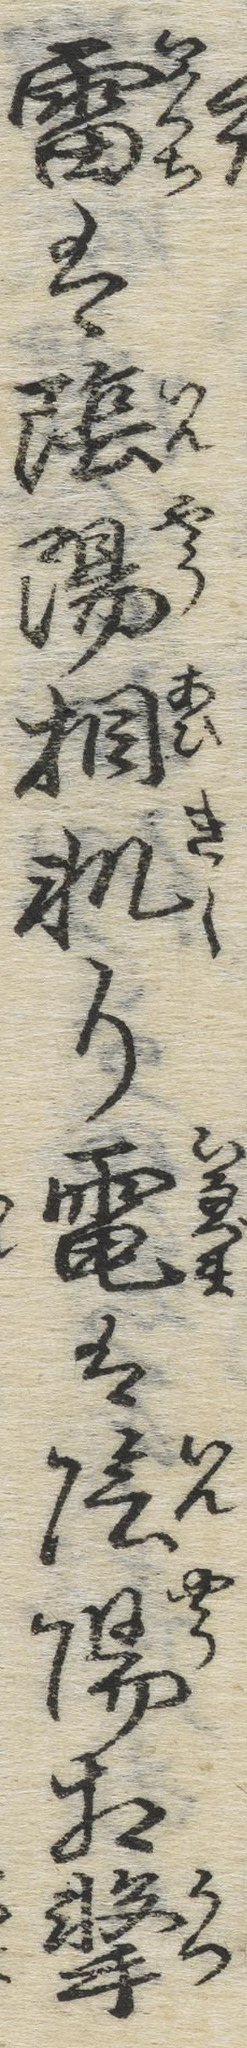雷は陰陽相軋り電は陰陽相撃
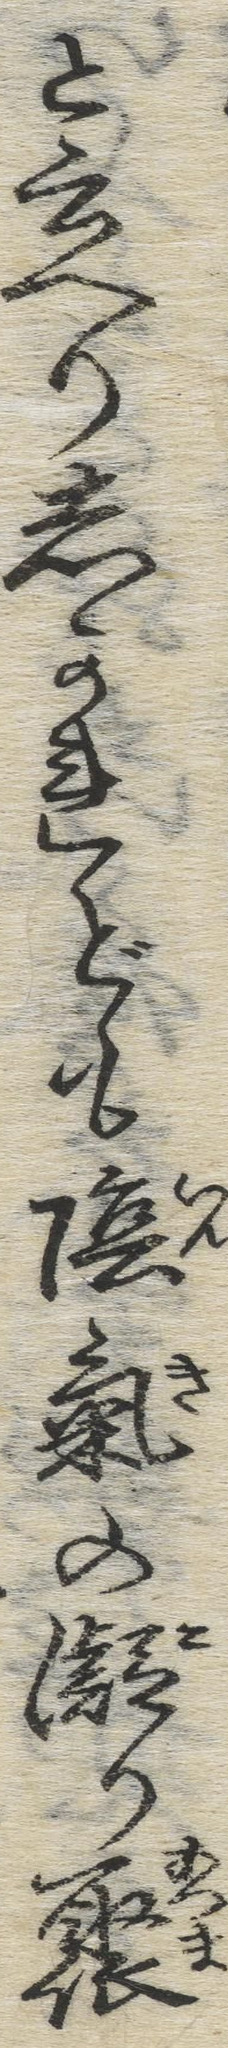と云へりしかれども陰気の凝り聚
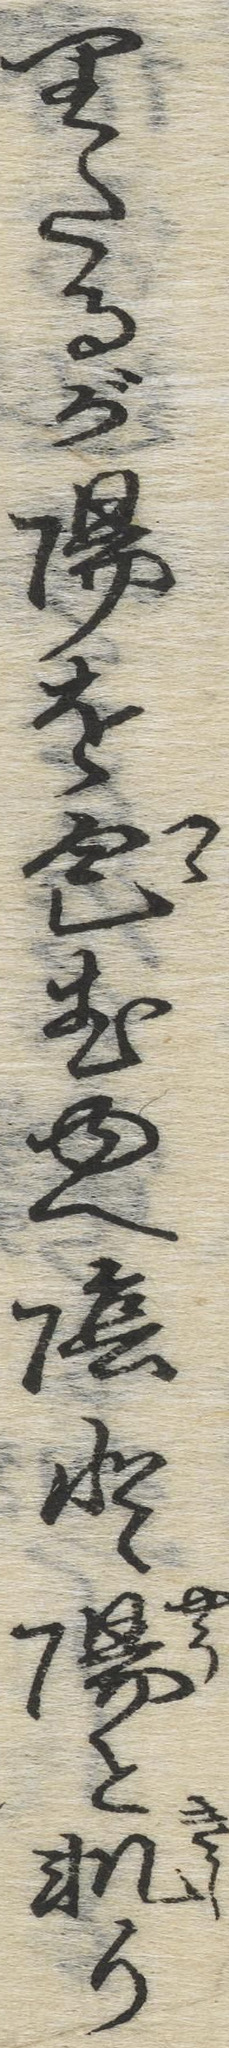りたるが陽を包むゆへ陰と陽と軋り
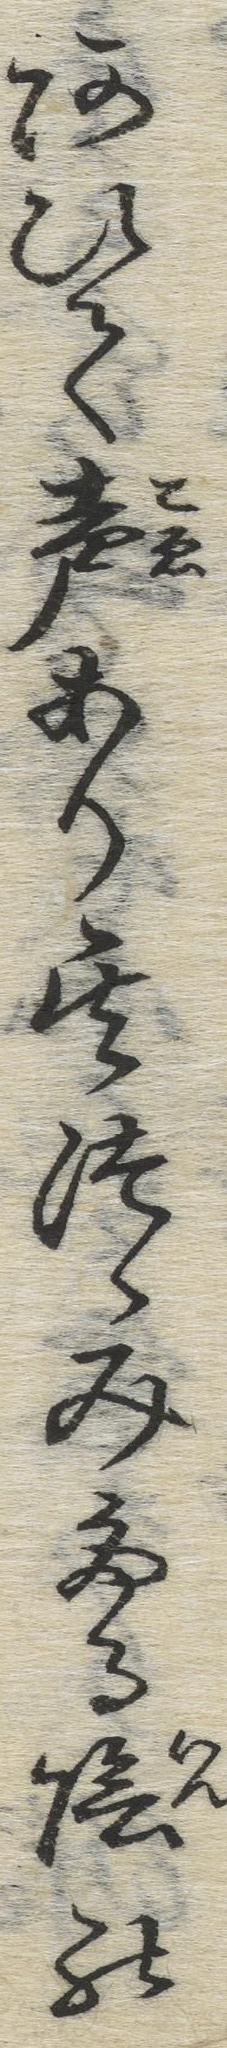あひて声あり其つゝみたる陰の
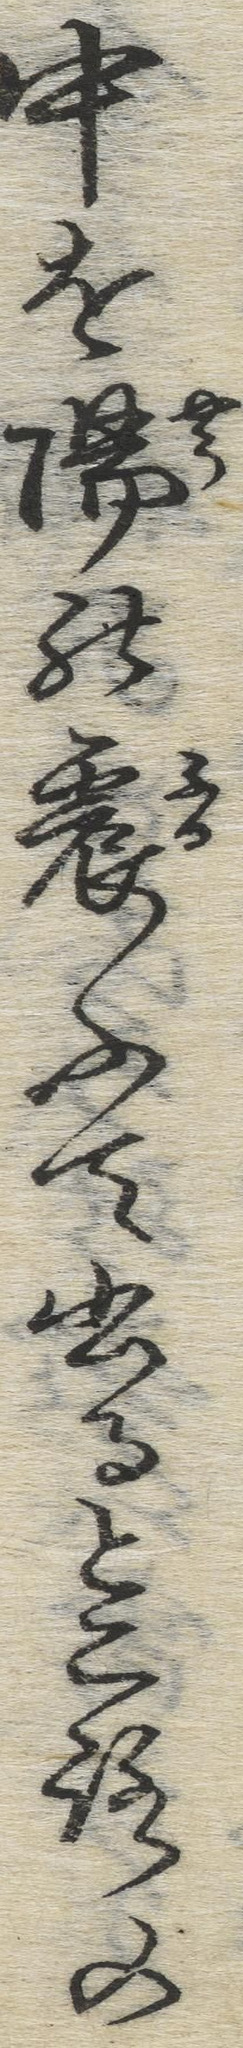中を陽の震ふて出るところの
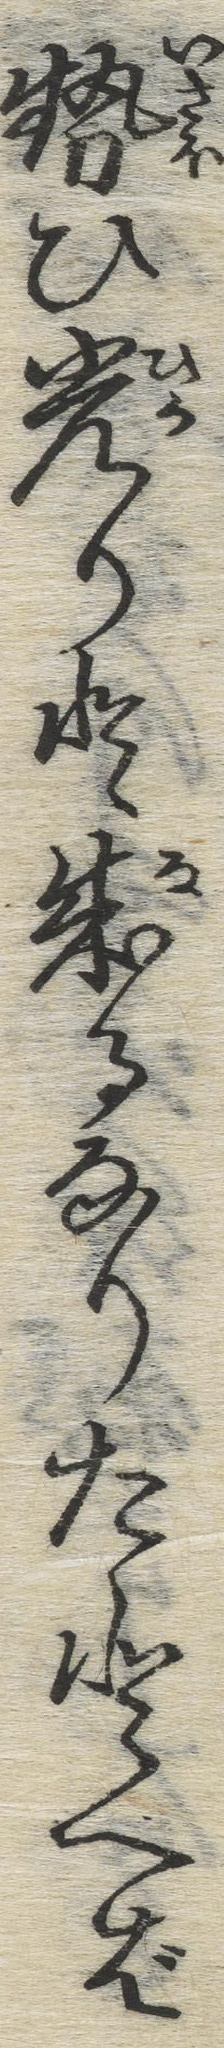勢ひ光りと成るなりたとへば

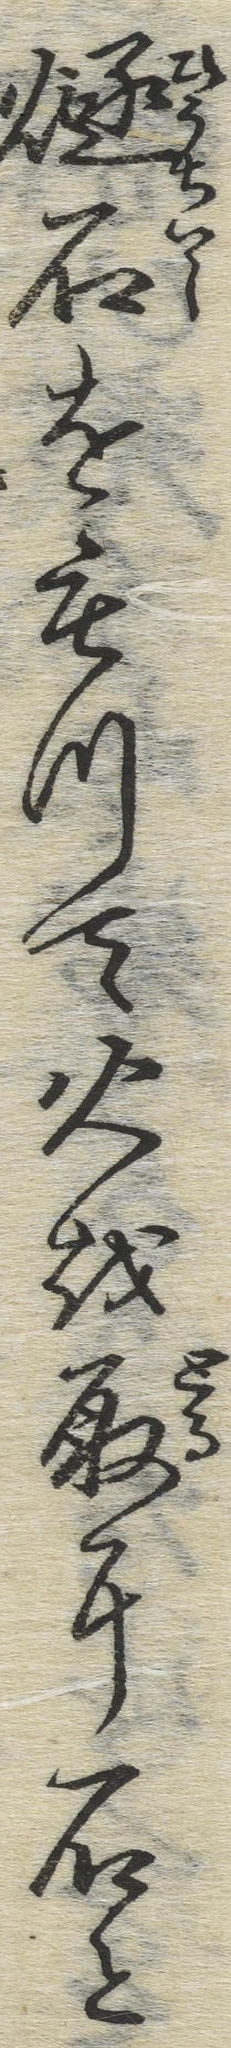燧石をもつて火を取に石と
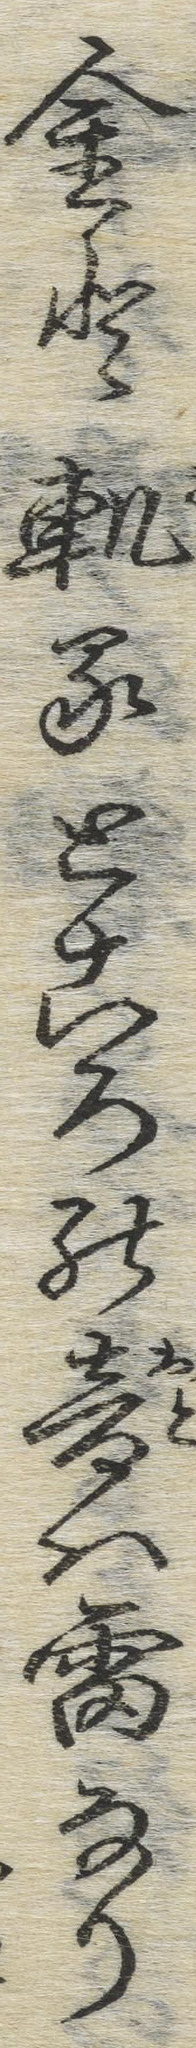金と軋るところの音は雷なり
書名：雷公地震由來記　全
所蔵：東京大学地震研究所図書室 Earthquake Research Institute Library, The University of Tokyo, JAPAN
